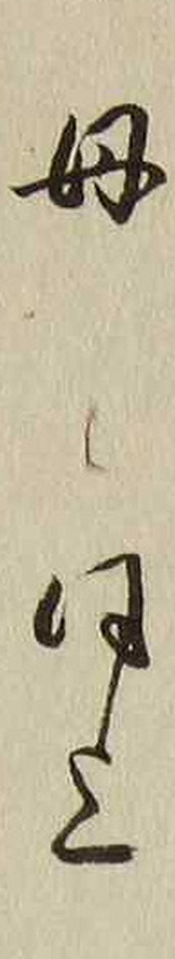母同上
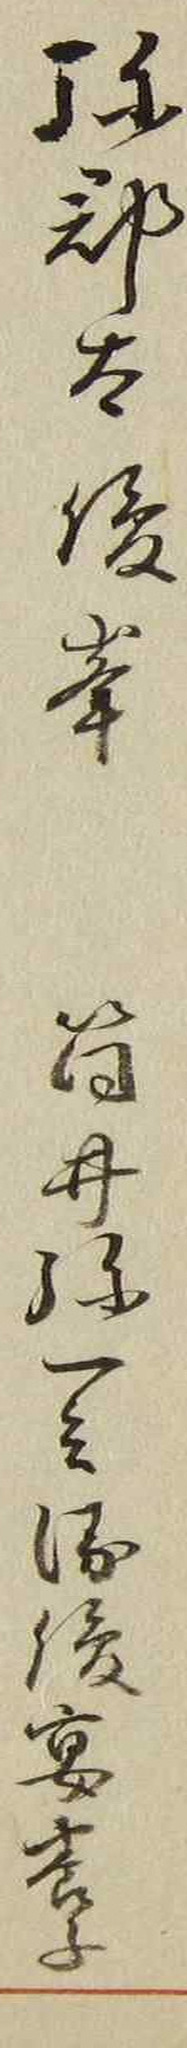弥部太俊峯筒井弥兵衛俊宴養子

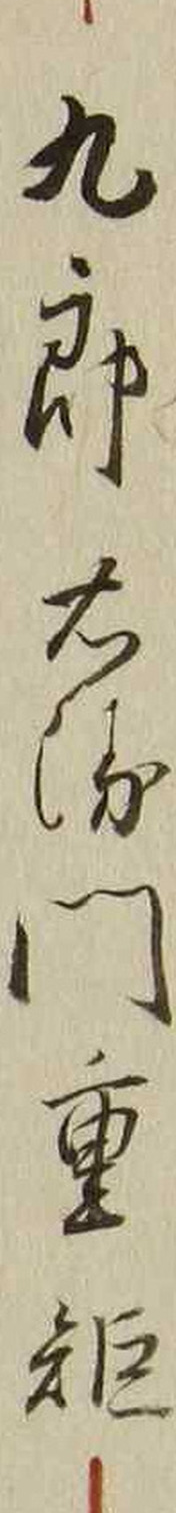九郎右衛門重矩
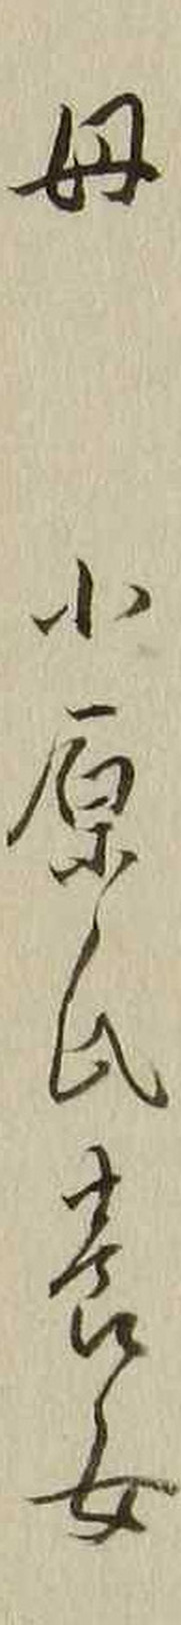母小原氏養女
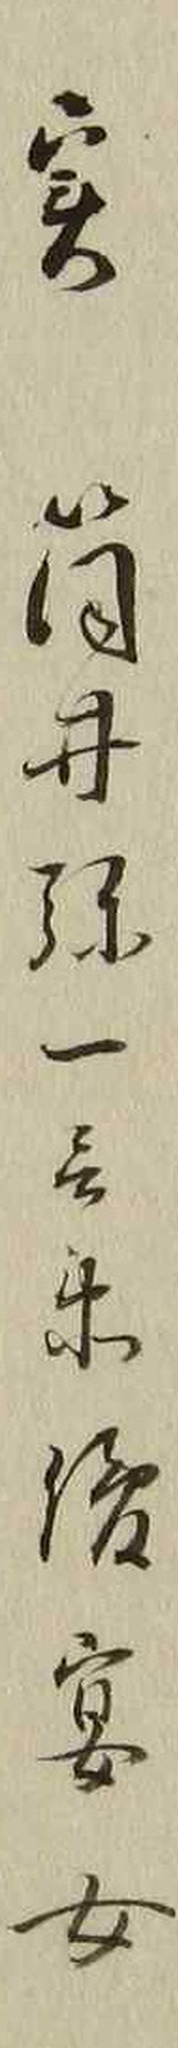実筒井弥一兵衛俊宴女
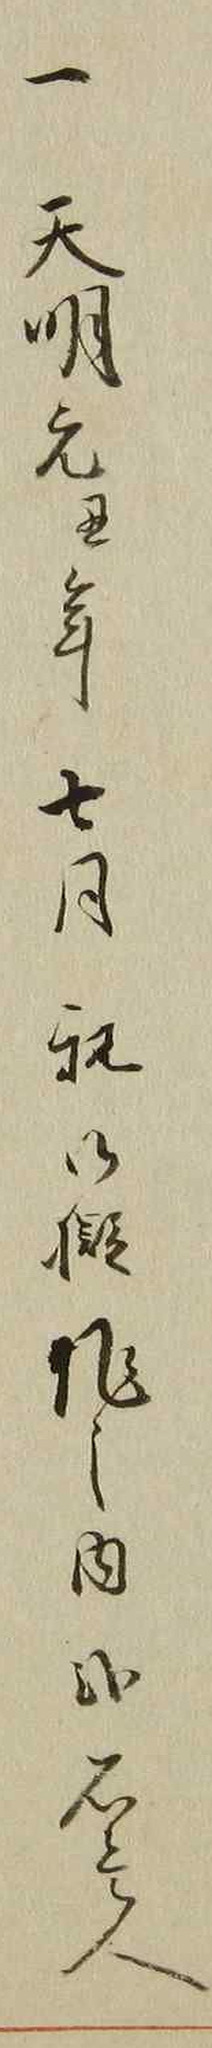一天明元丑年七月親御擬作之内弐石壱人
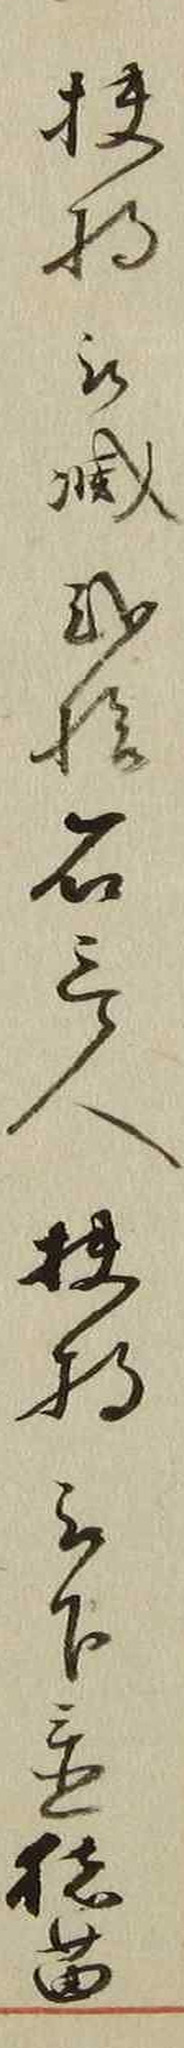扶持被減弐拾石三人扶持被下置猪苗
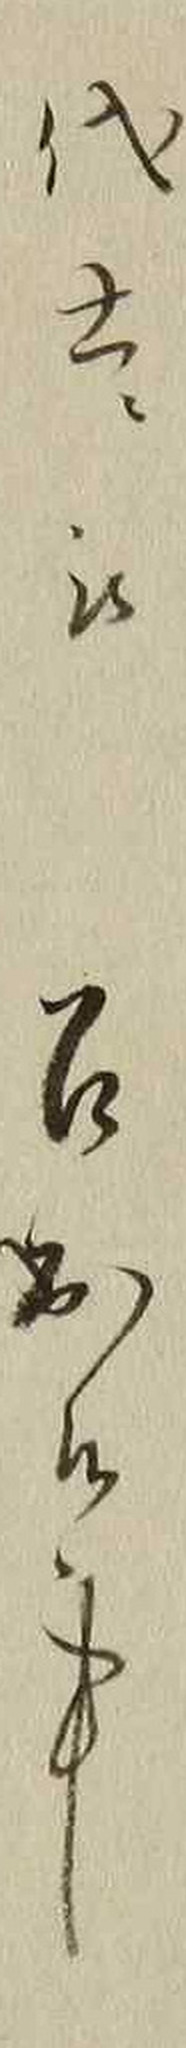代士ニ被召出候事
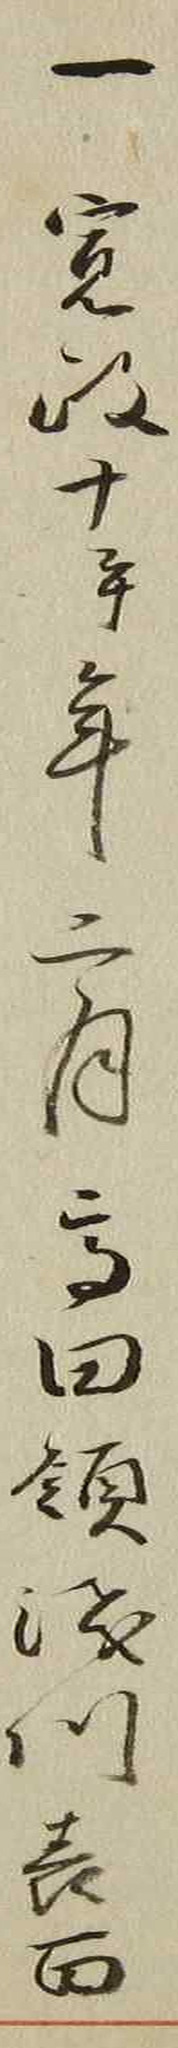一寛政十午年二月高田領浅川表百
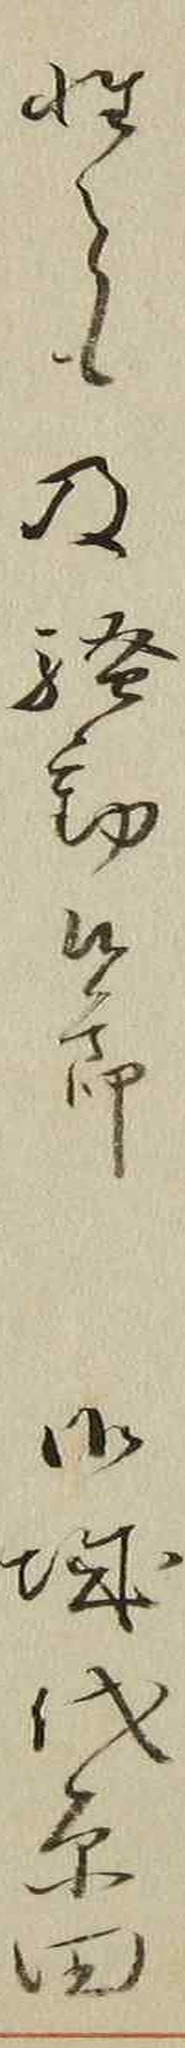姓とも及騒動候節御城代原田
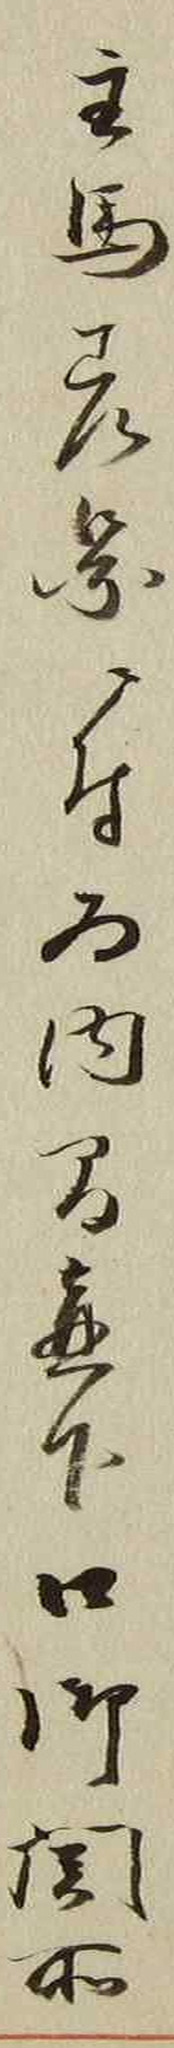主馬差図ニ付為内間置下口御関所
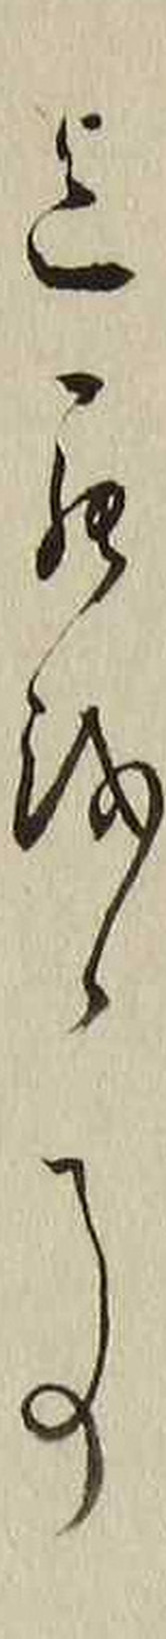迄罷越候事
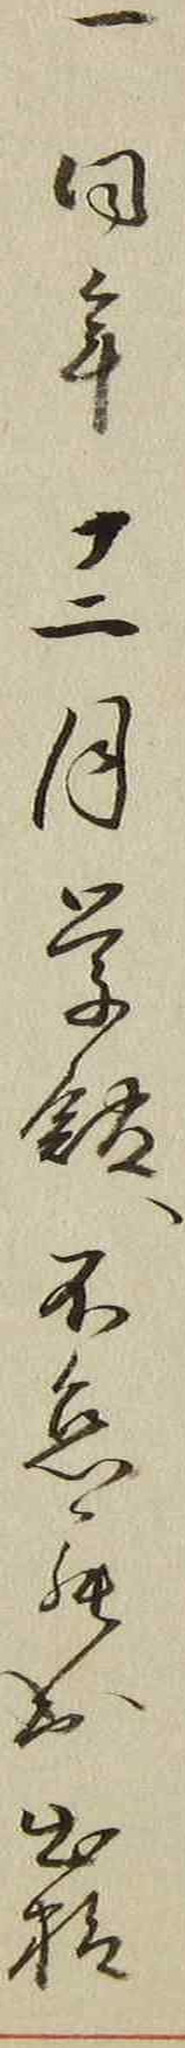一同年十二月学館へ不怠ニ罷出出精
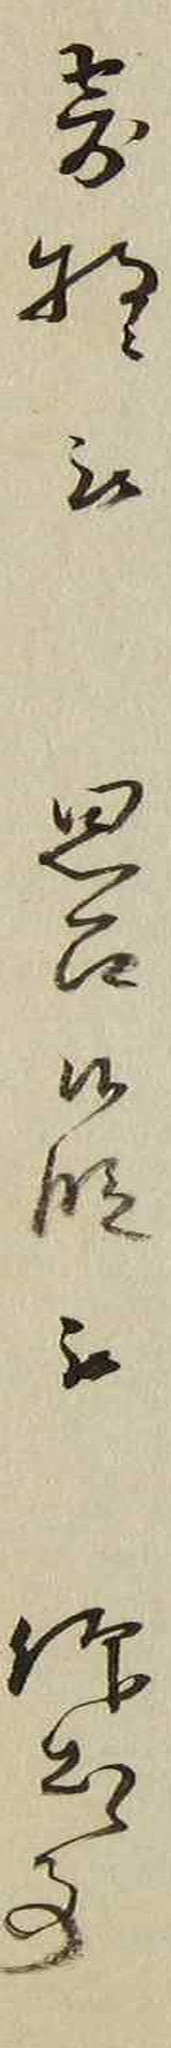奇特ニ被思召候段被仰出候事
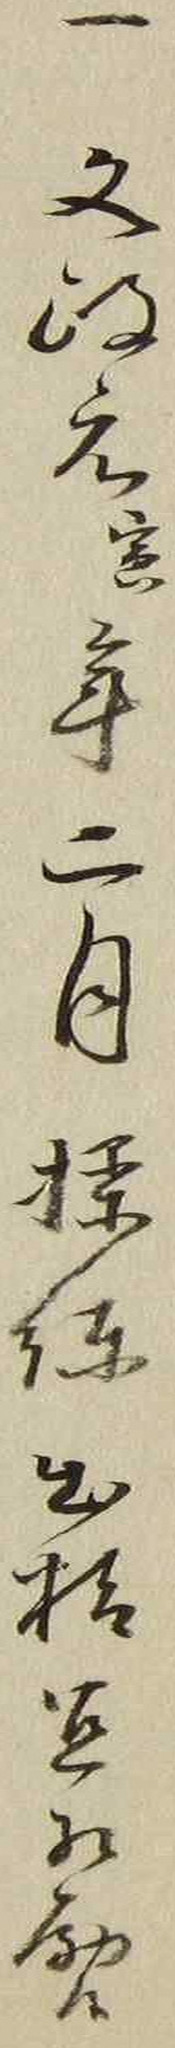一文政元寅年二月操練出精宜相励候
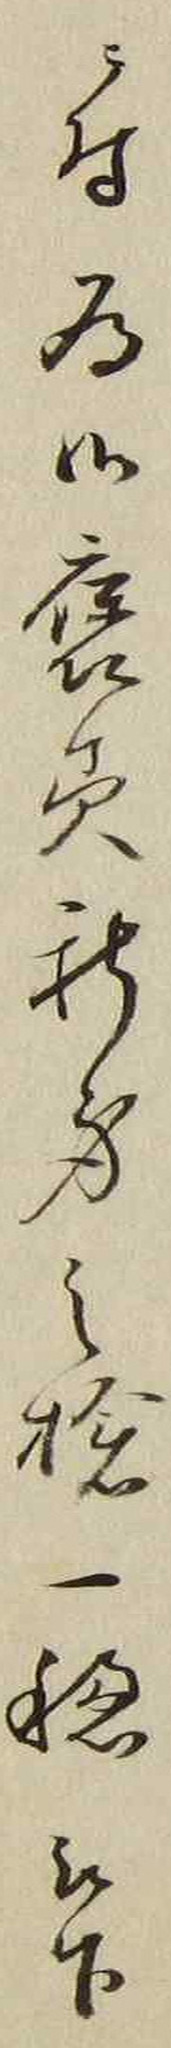ニ付為御褒美新身之槍一穂被下
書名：諸士系譜　巻之32　い之部32
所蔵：会津若松市立会津図書館
